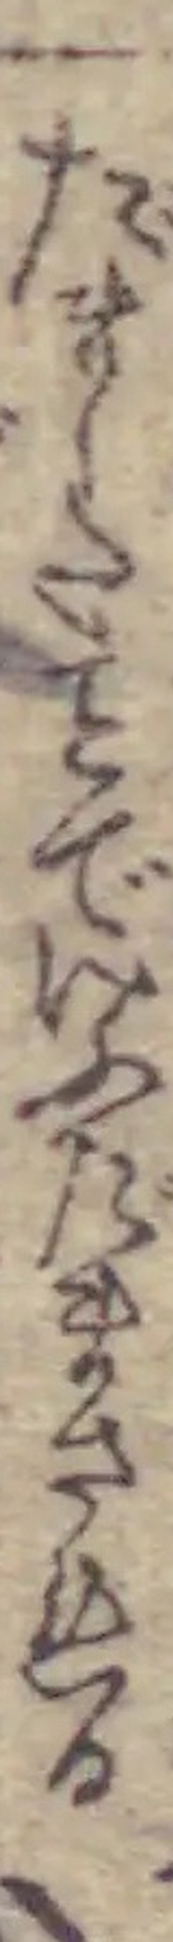だましたことでけふだまされる
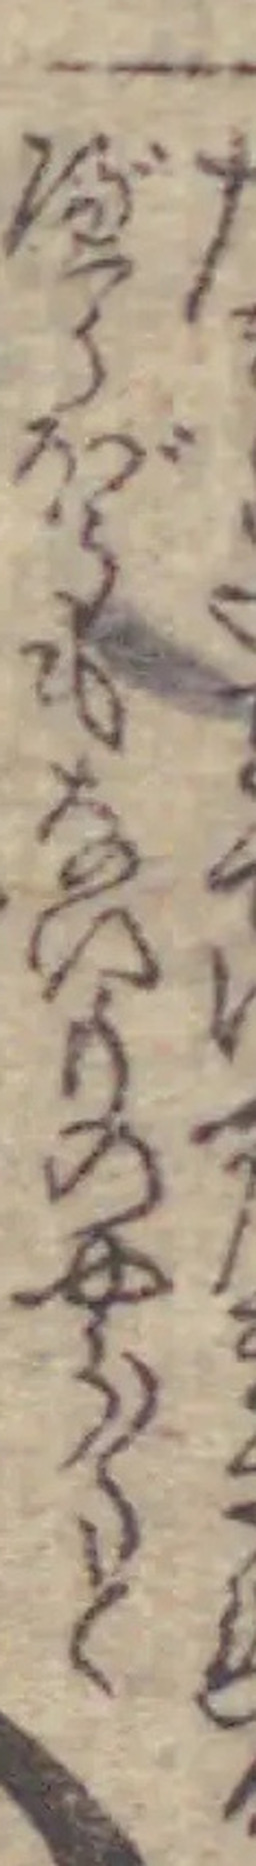べらぼうもないものやう〳〵と
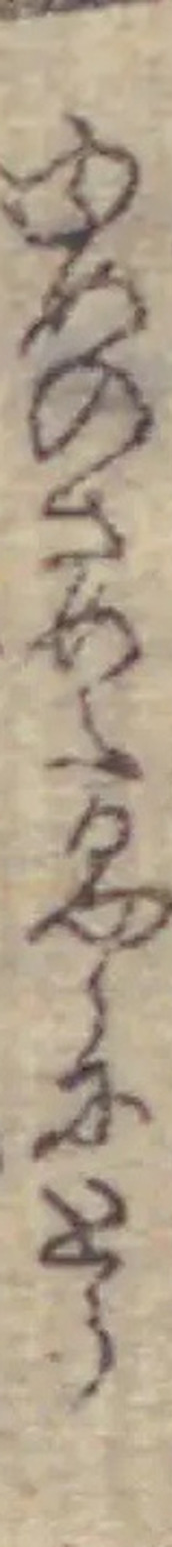ゆめのさめたるやうにとう
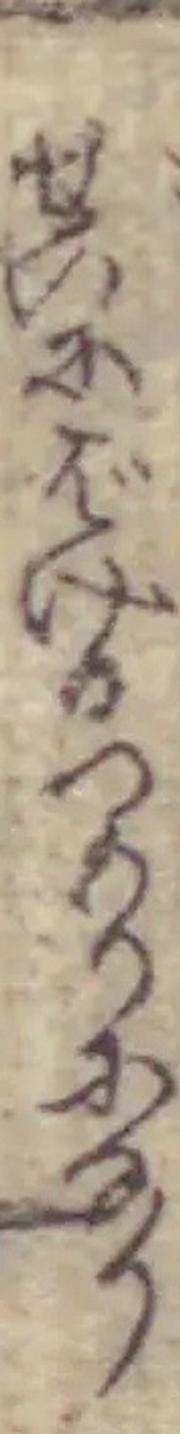せいにばけるつもりになり
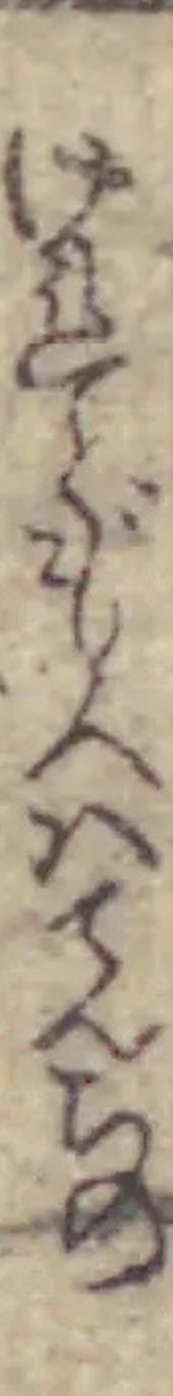けれども人はてんちの
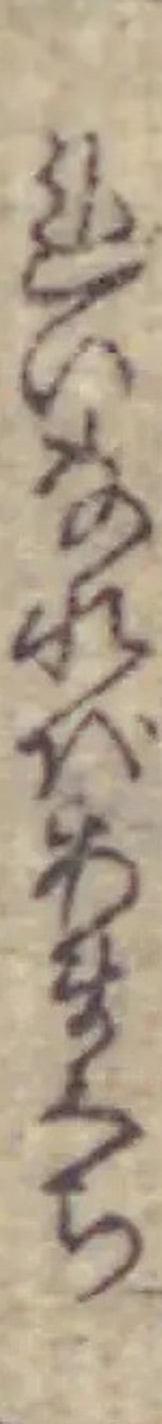れいなればあまつち
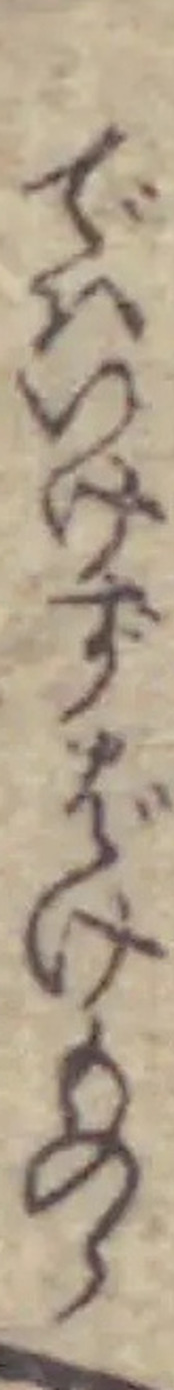ではいけずばけものら
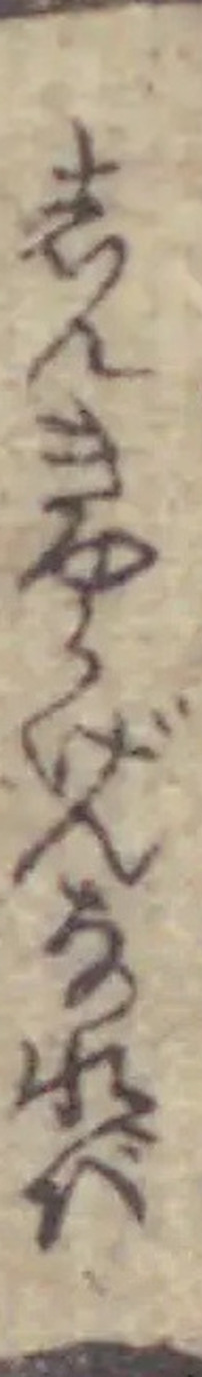しんきやうげんなれば
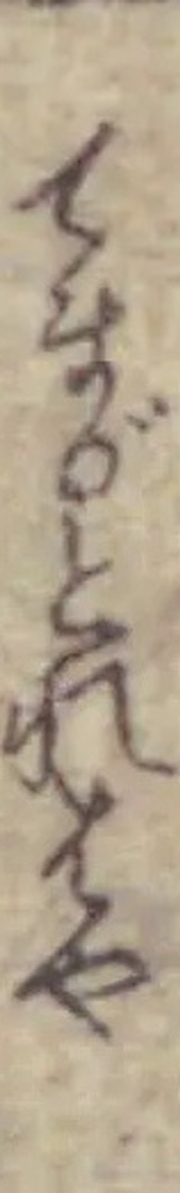てまがとれはや
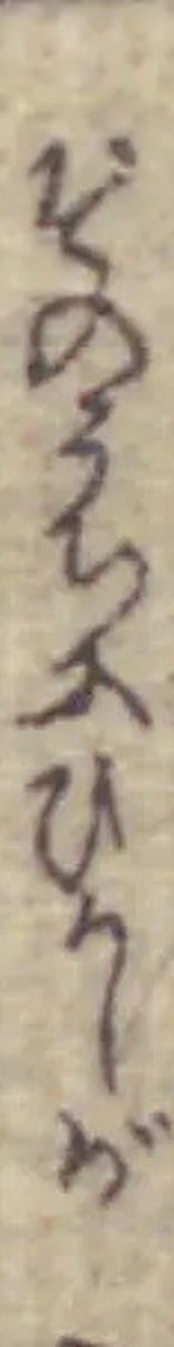そのうちにひかしが
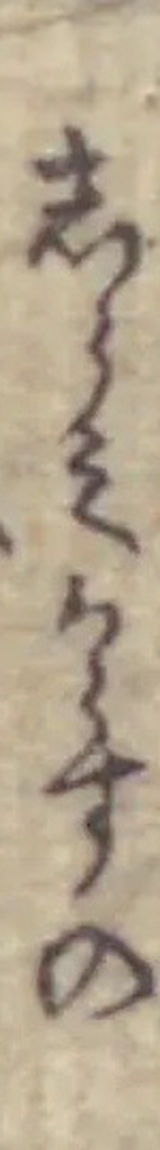しらみからすの
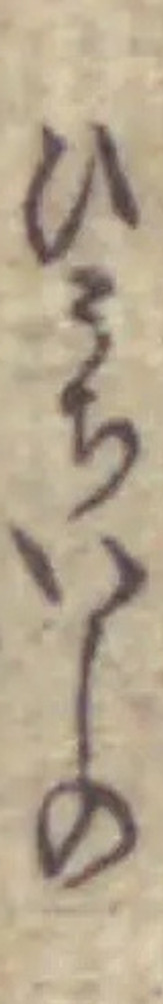ひうちいしの
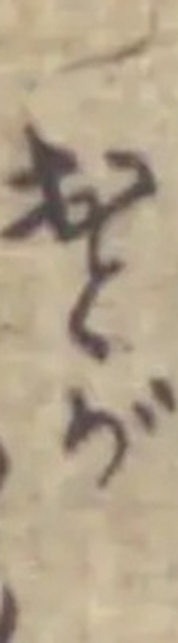おとが
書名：化物昼寝鼾 2巻
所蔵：国立国会図書館 National Diet Library, JAPAN
